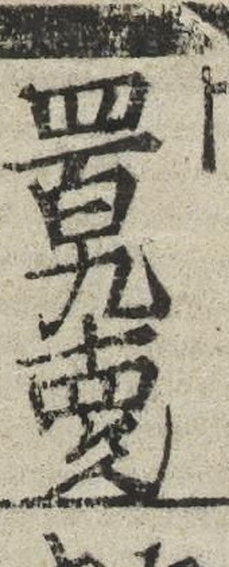四百九十四けん
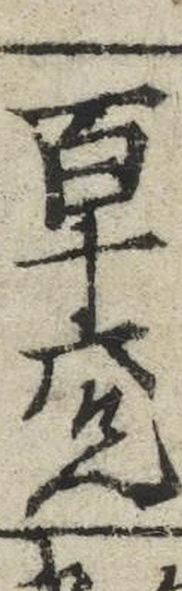百十六けん
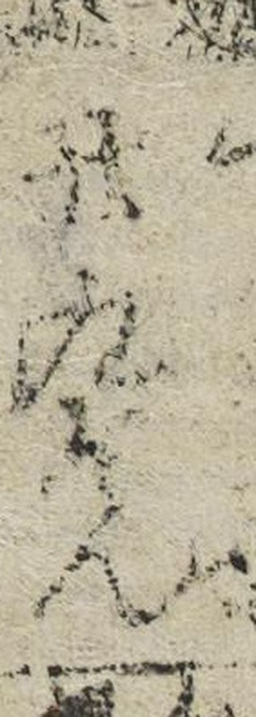廿九けん
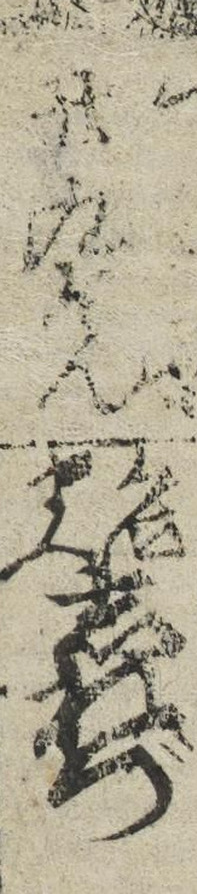廿九けん

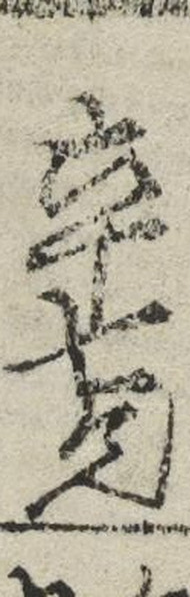六十七けん
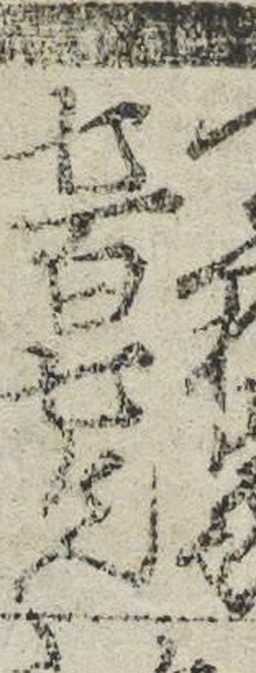七百七けん
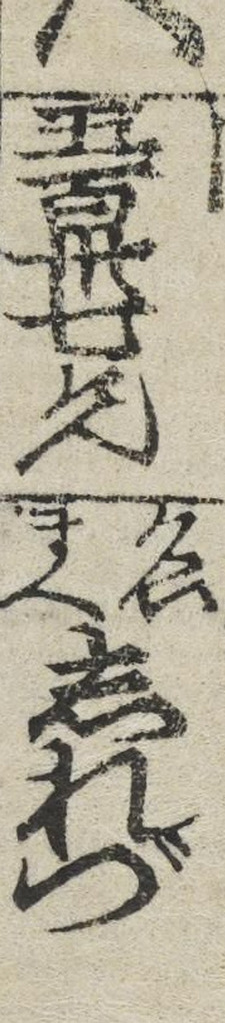五百丗七けん
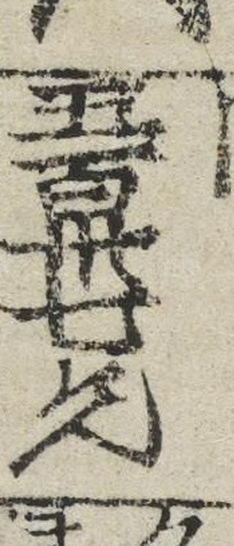五百丗七けん
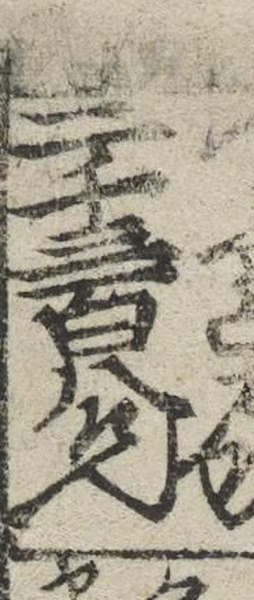二千三百八けん
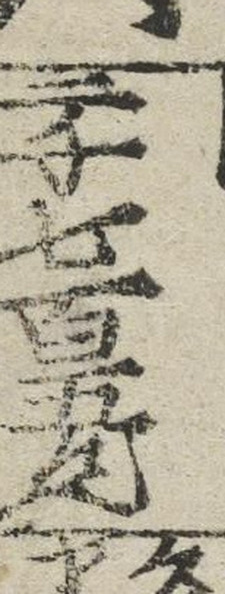二千七百五けん
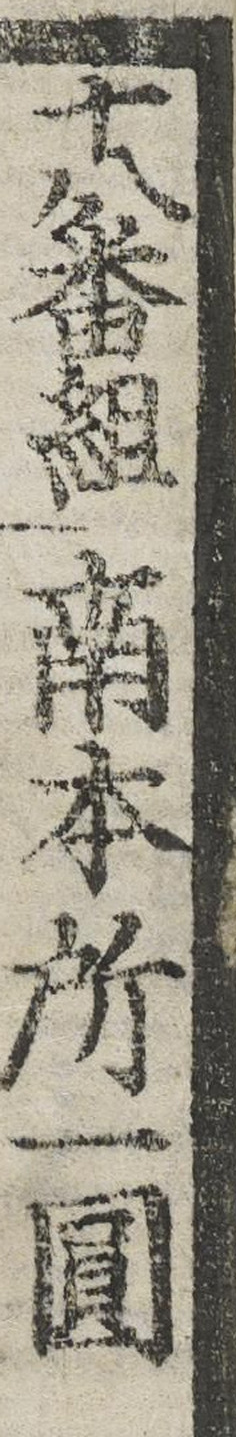十八番組南本所一円
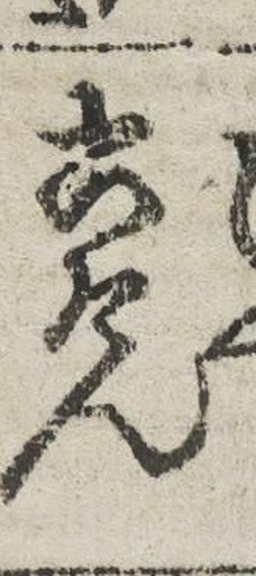六けん
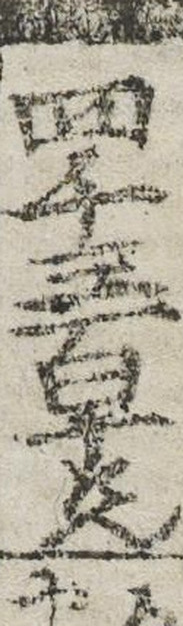四千三百十けん
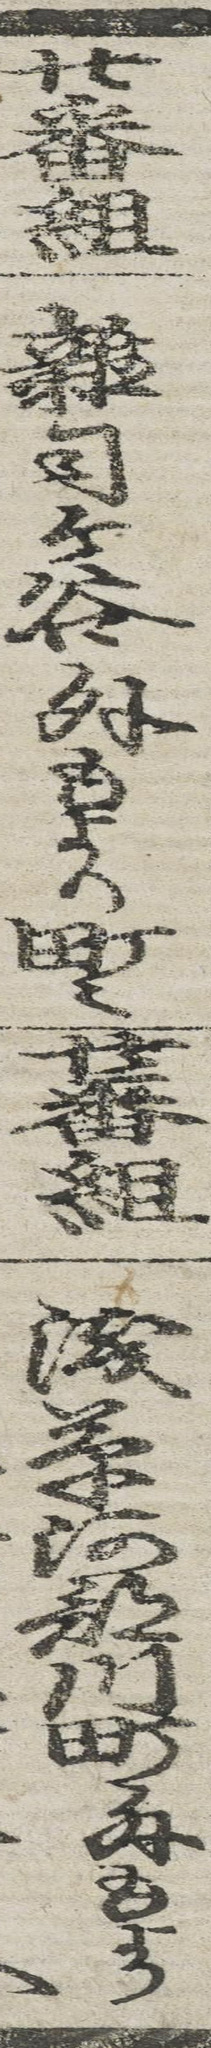廿番組雑司ケ谷外もより町〻
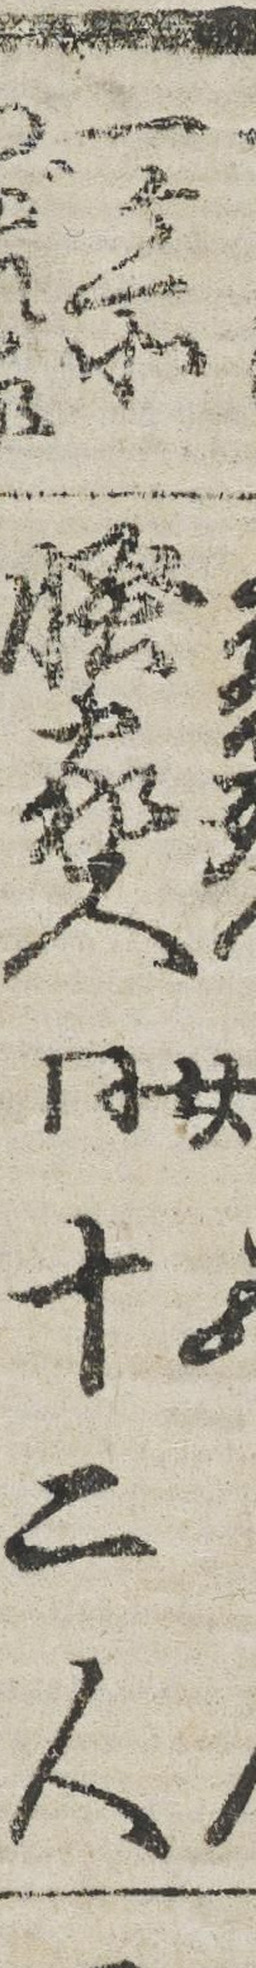一ヶ所怪我人同十二人
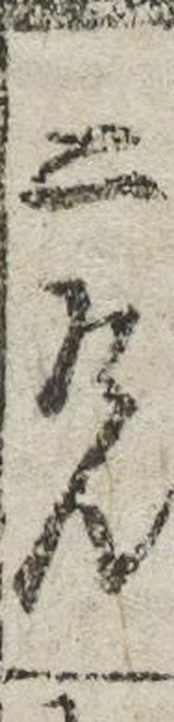二けん
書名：[明暦大火に関する冊子]
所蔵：東京大学地震研究所図書室 Earthquake Research Institute Library, The University of Tokyo, JAPAN
